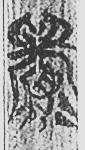{興頁分}
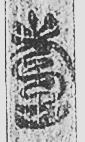壽
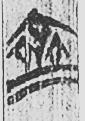齊
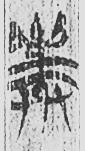襄
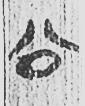公
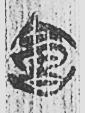會
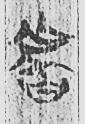者
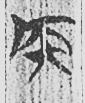侯
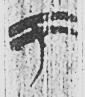于
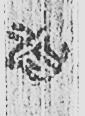首
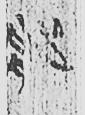{爿止}
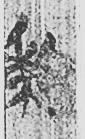殺
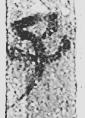子
